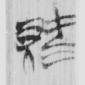資
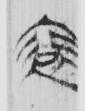裕
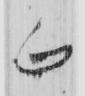㠯（以）
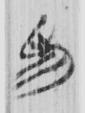易
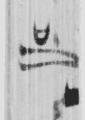足
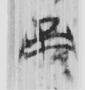甬
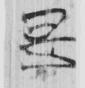是
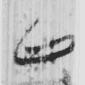㠯（以）
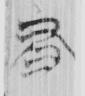有
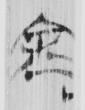余
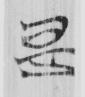是
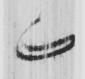㠯（以）
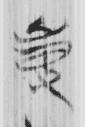尃
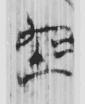均
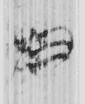於
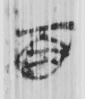百
